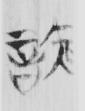{言夜}
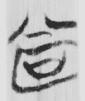甚
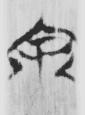余
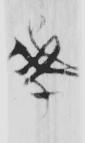我
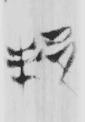邦
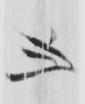之
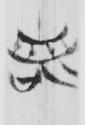若
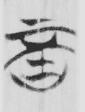否
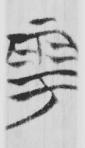𩁹
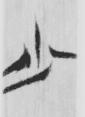少
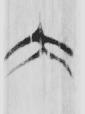大
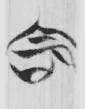命
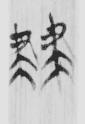{㣇㣇}
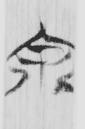余
